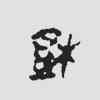梪
